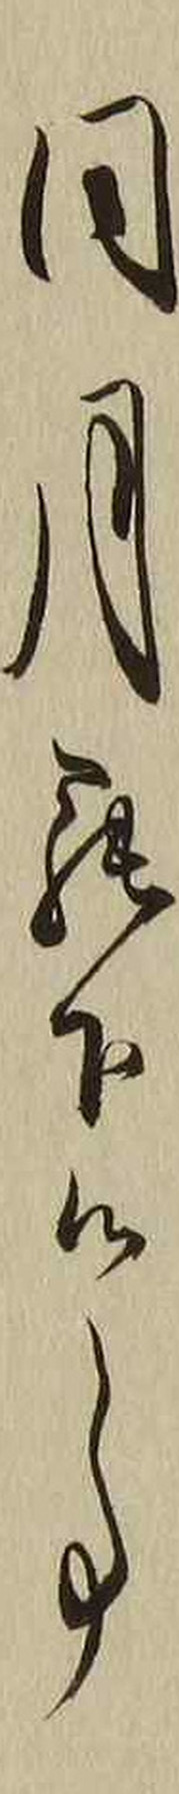同月罷下候事
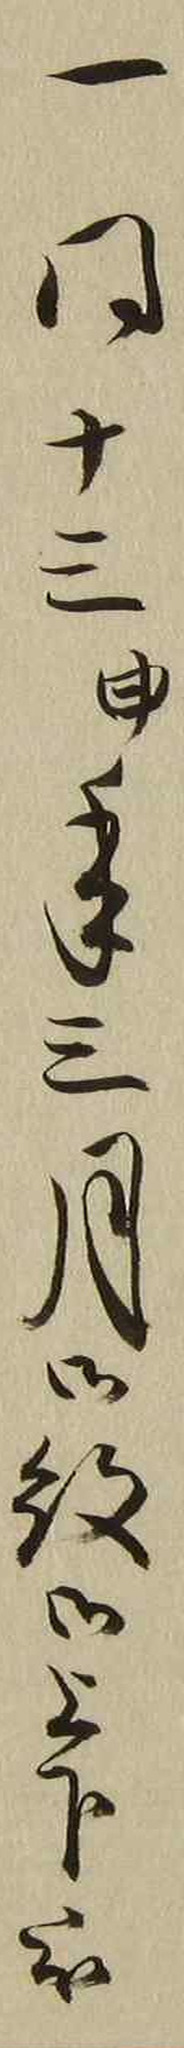一同十三申年三月御紋御上下被
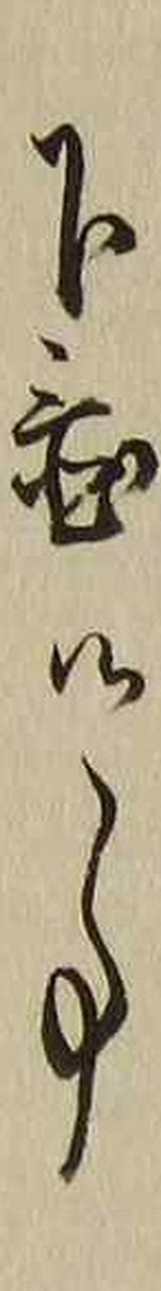下置候事
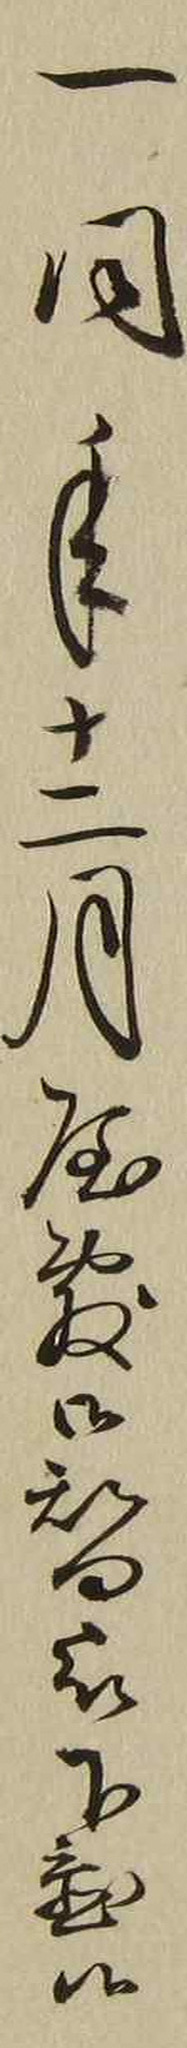一同年十二月屋敷御替被下置候
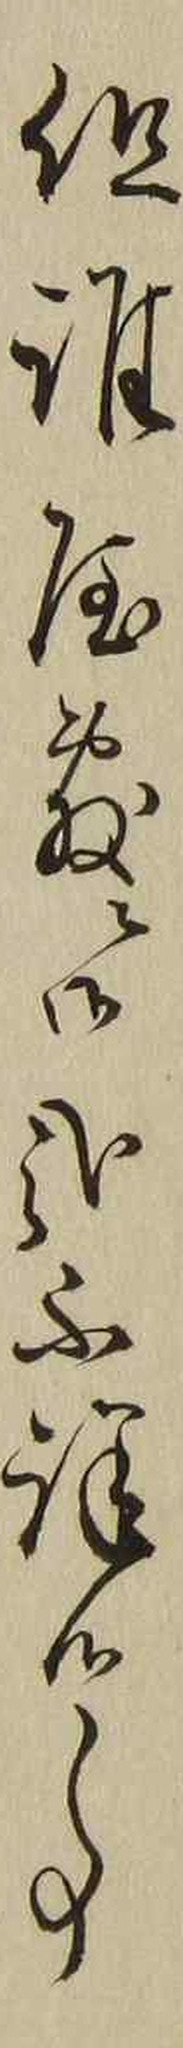但誰屋敷ニ候哉不詳候事
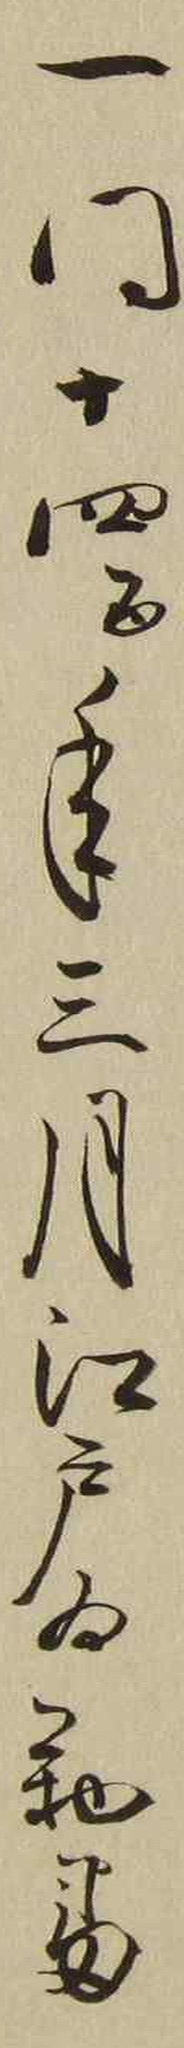一同十四酉年月三月江戸為勤番

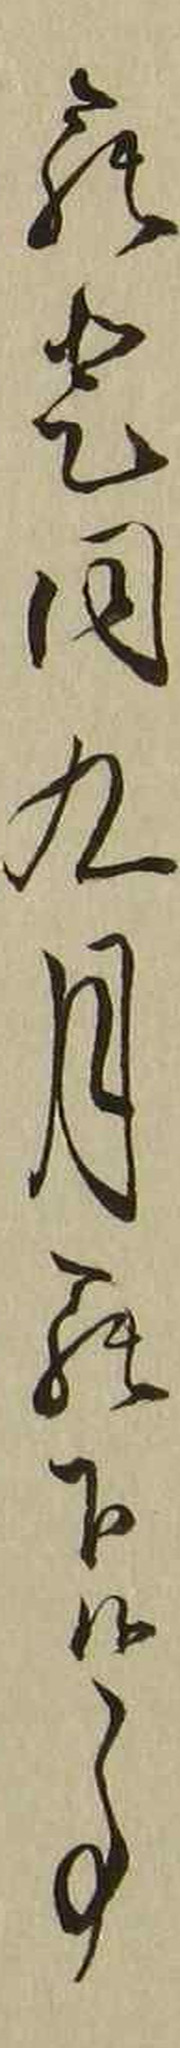罷登同九月罷下候事
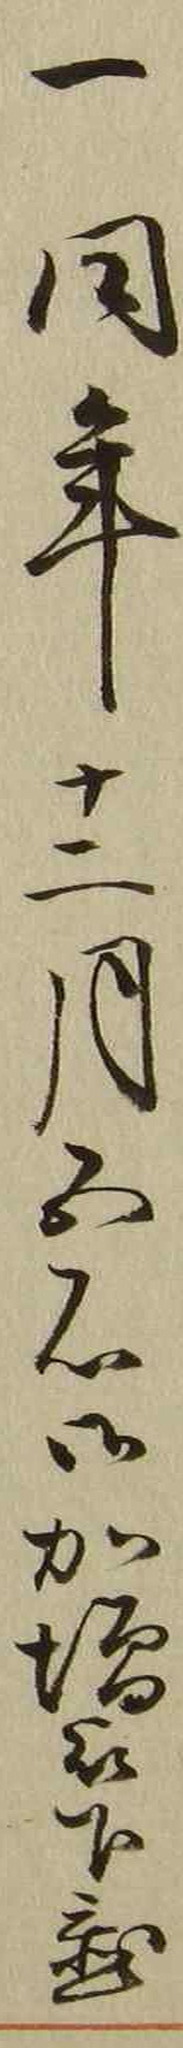一同年十二月五石御加増被下置
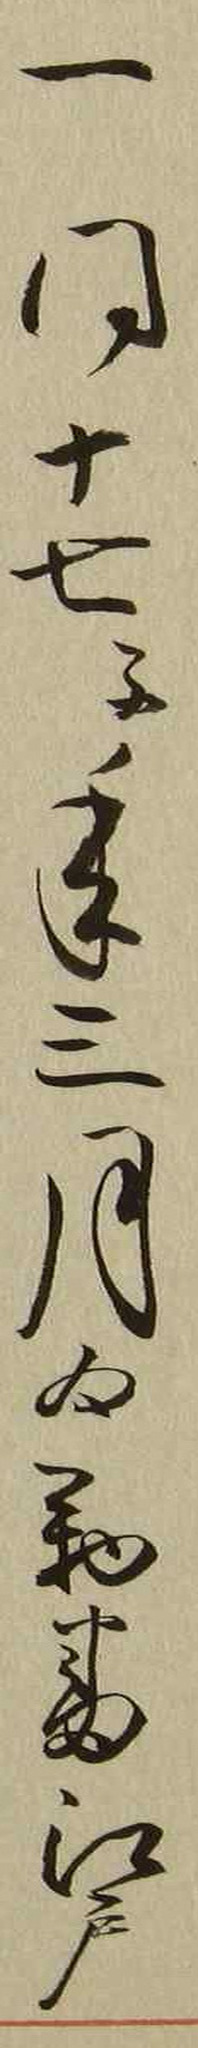一同十七子年三月為勤番江戸
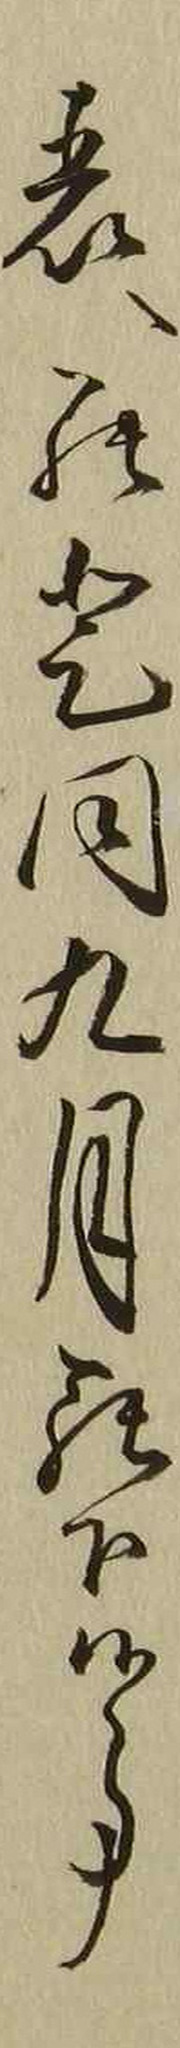表へ罷登同九月罷下候事
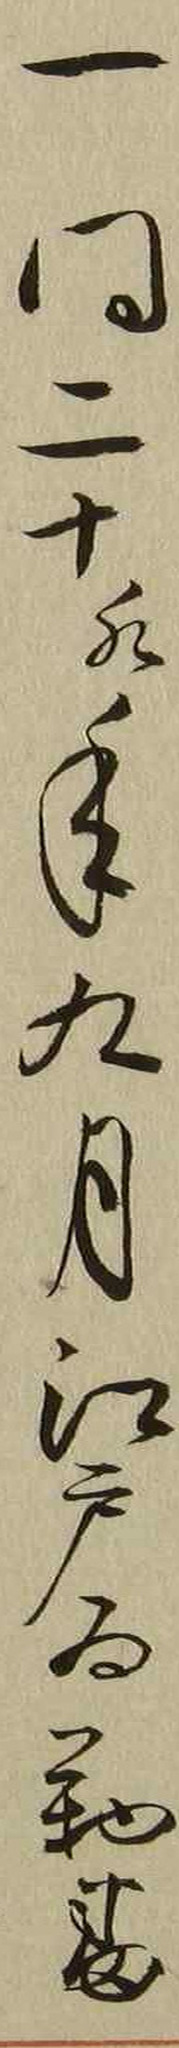一同二十卯年九月江戸為勤番
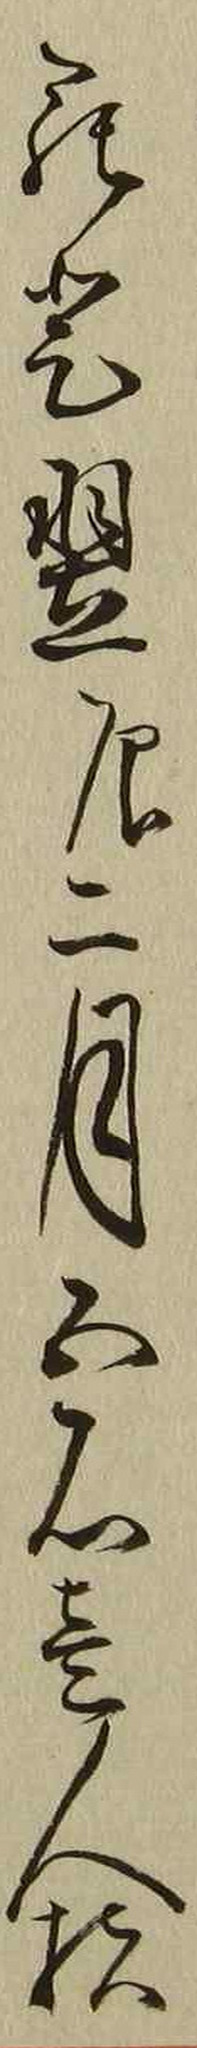罷登翌辰二月五石壱人扶
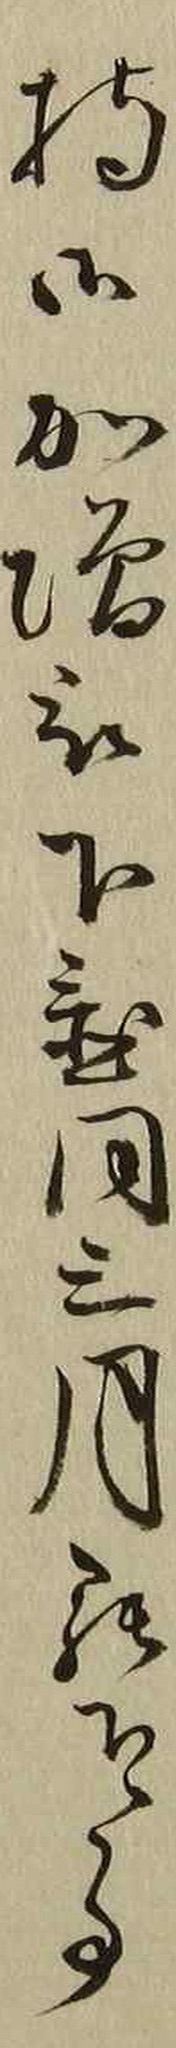持御加増被下置同三月罷下候事
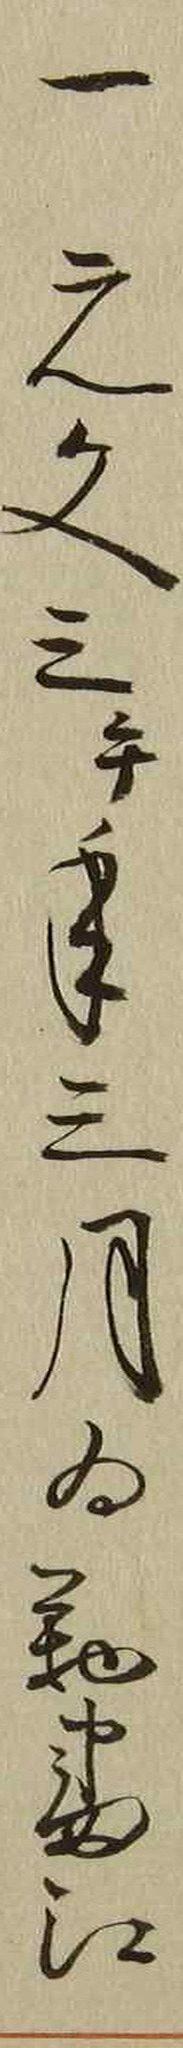一元文三午年三月為勤番江
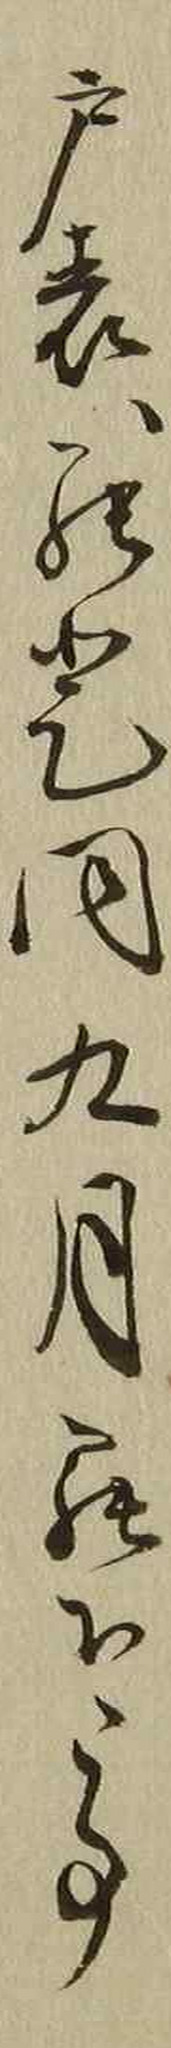戸表へ罷登同九月罷下候事
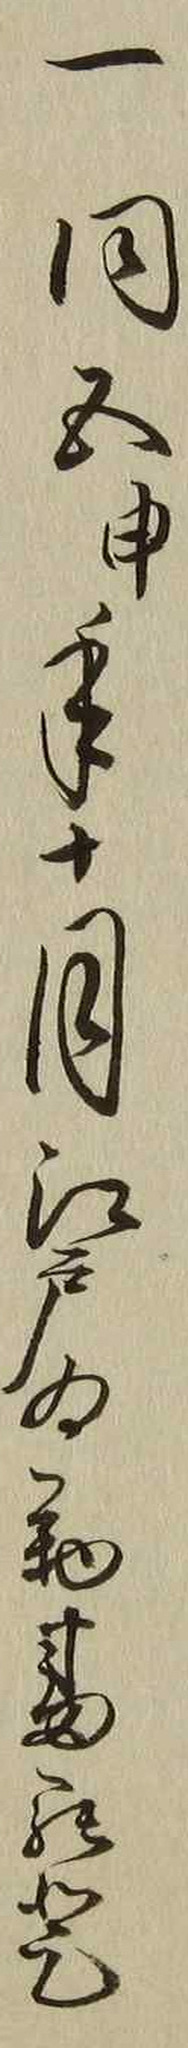一同五申年十月江戸為勤番罷登
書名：諸士系譜　巻之57　ほ之部4
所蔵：会津若松市立会津図書館
